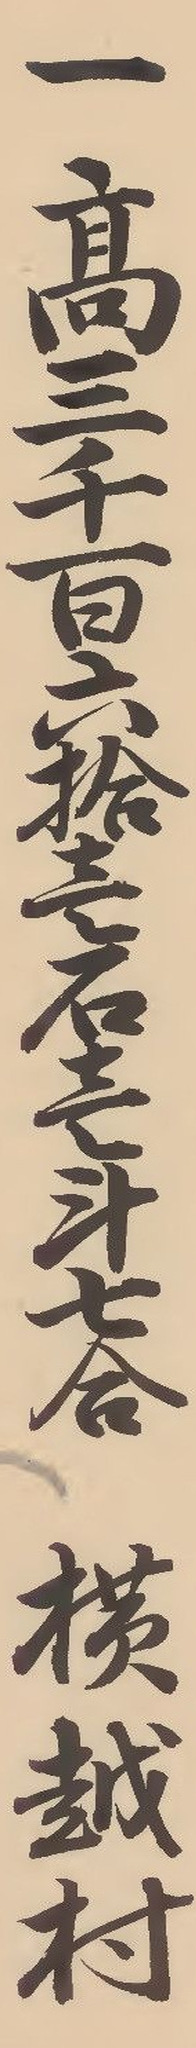一高三千百六拾壱石壱斗七合横越村

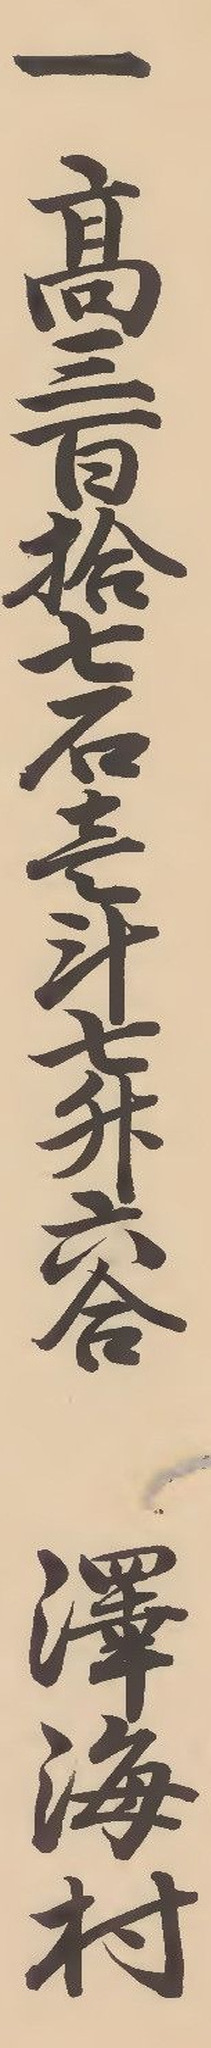一高三百拾七石壱斗七升六合沢海村
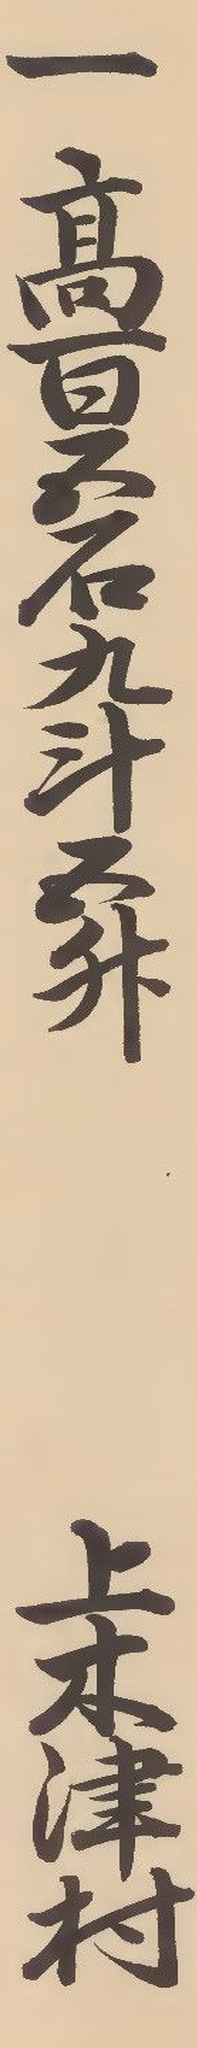一高百五石九斗五升上木津村
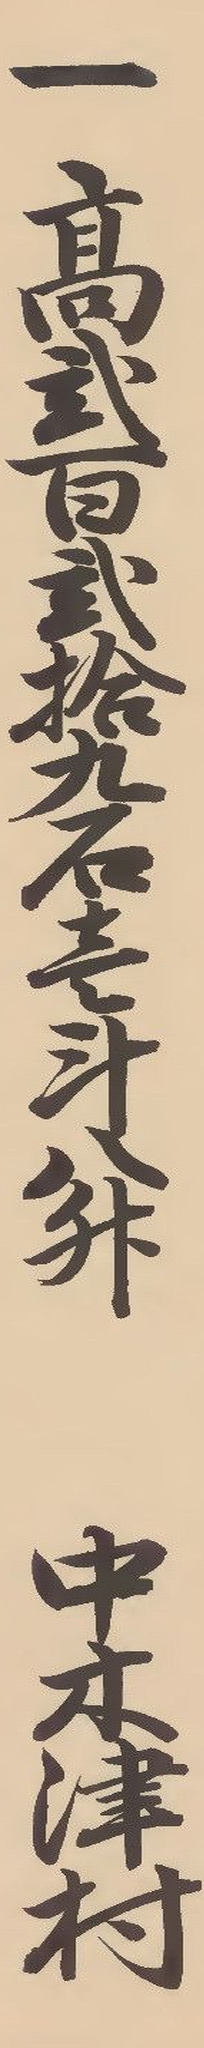一高弐百弐拾九石壱斗八升中木津村
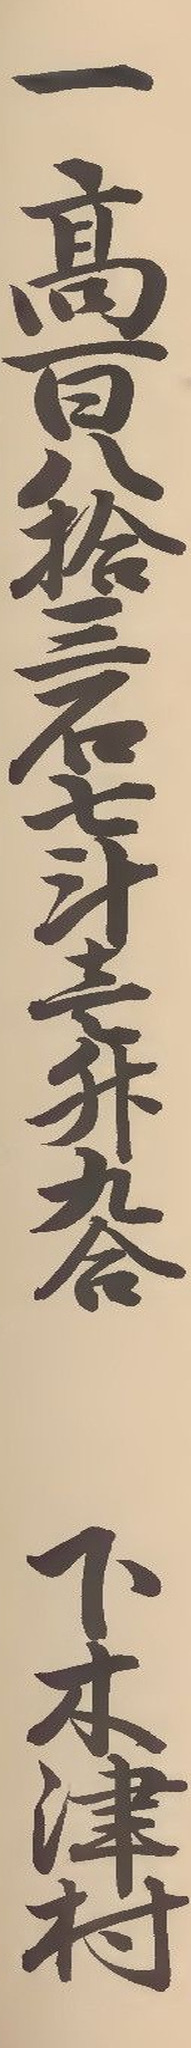一高百八拾三石七斗壱升九合下木津村
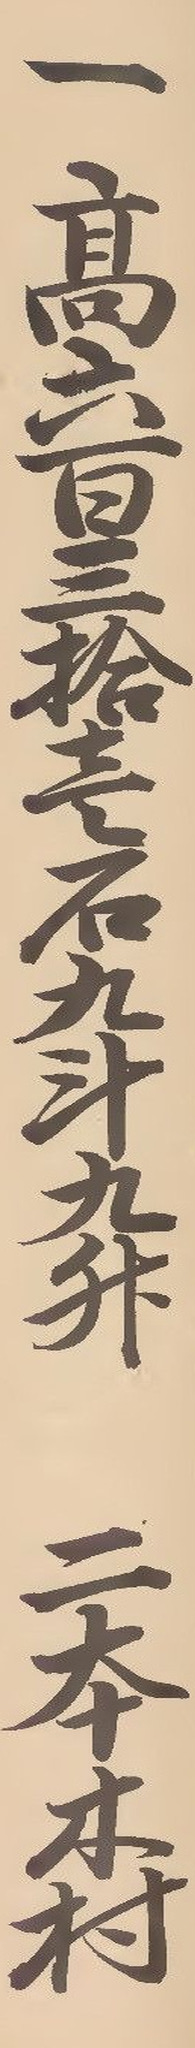一高六百三拾壱石九斗九升二本木村
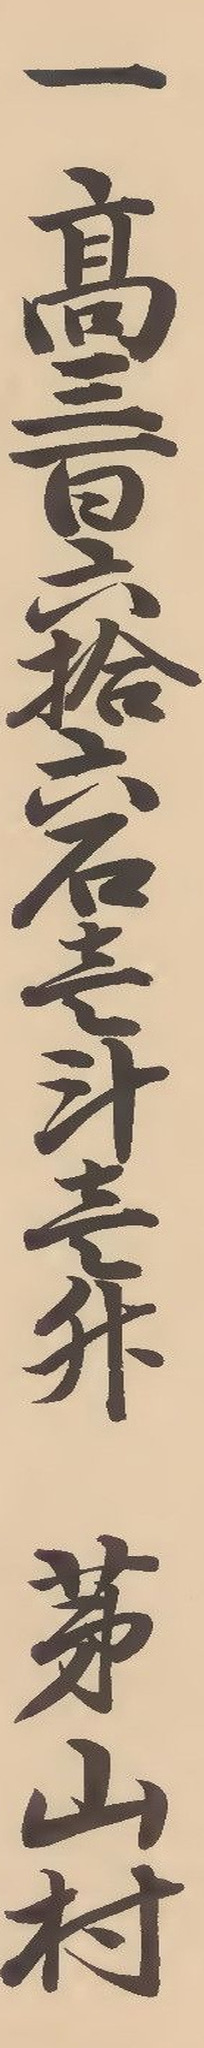一高三百六拾六石壱斗壱升茅山村
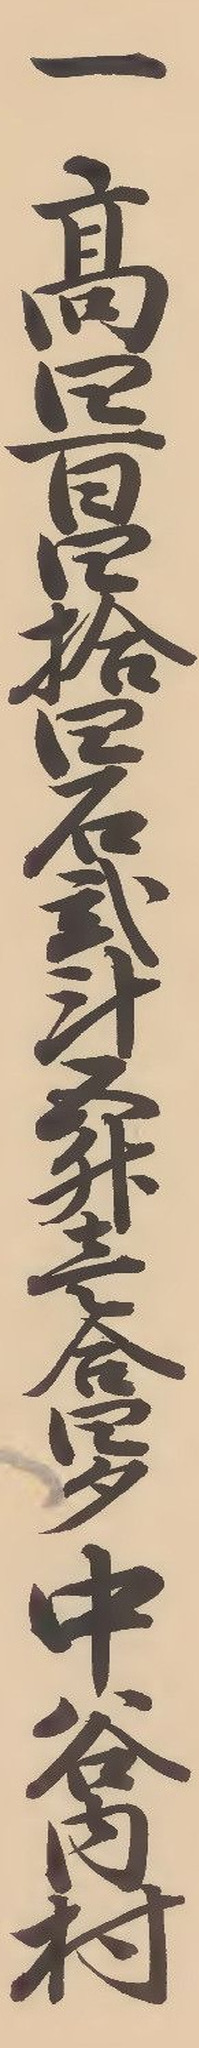一高四百四拾四石弐斗五升壱合四勺中谷内村

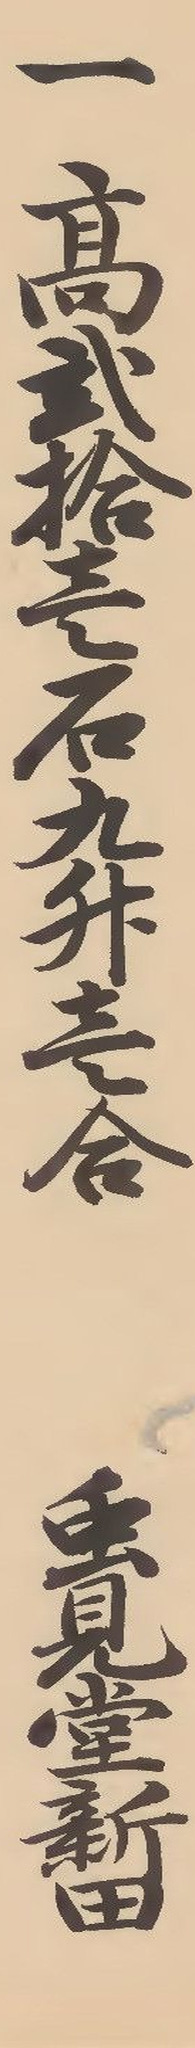一高弐拾壱石九升壱合虫見堂新田
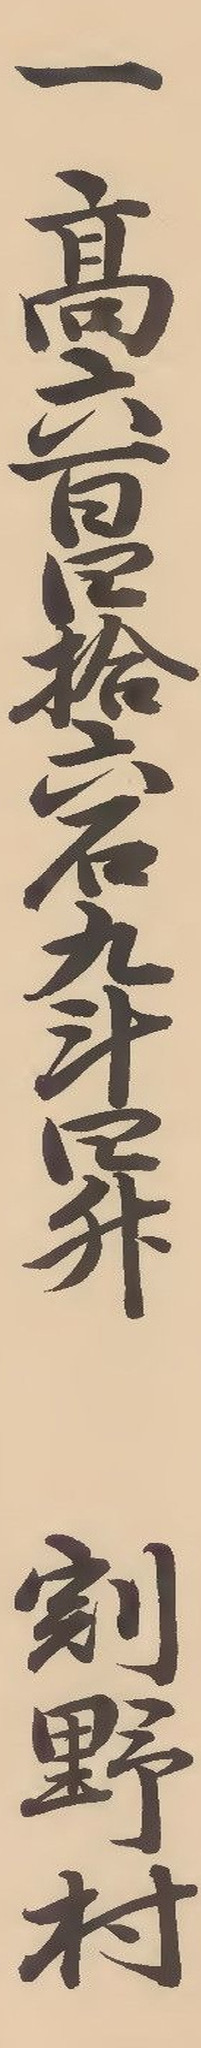一高六百四拾六石九斗四升割野村
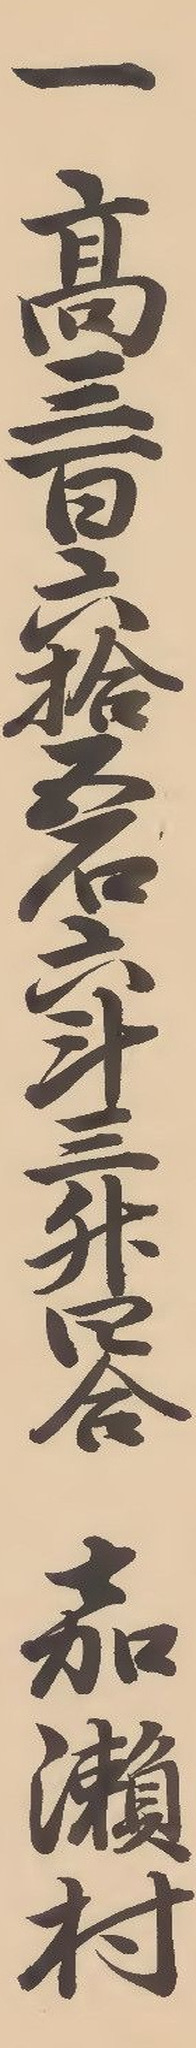一高三百六拾五石六斗三升四合嘉瀬村
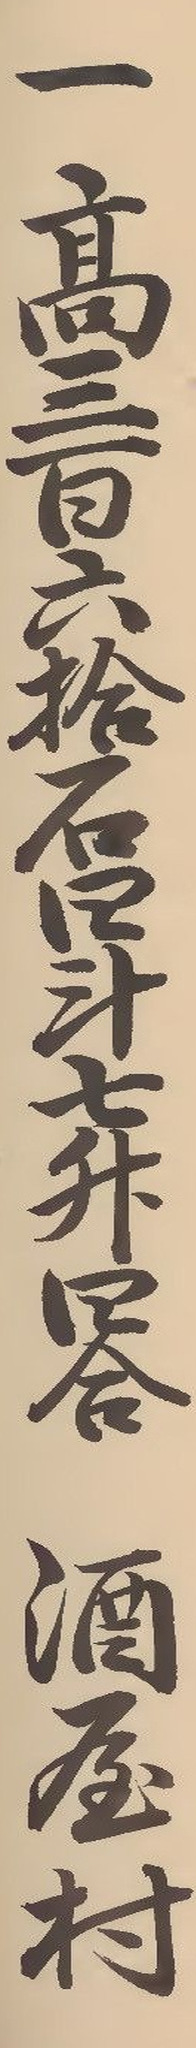一高三百六拾石四斗七升四合酒屋村
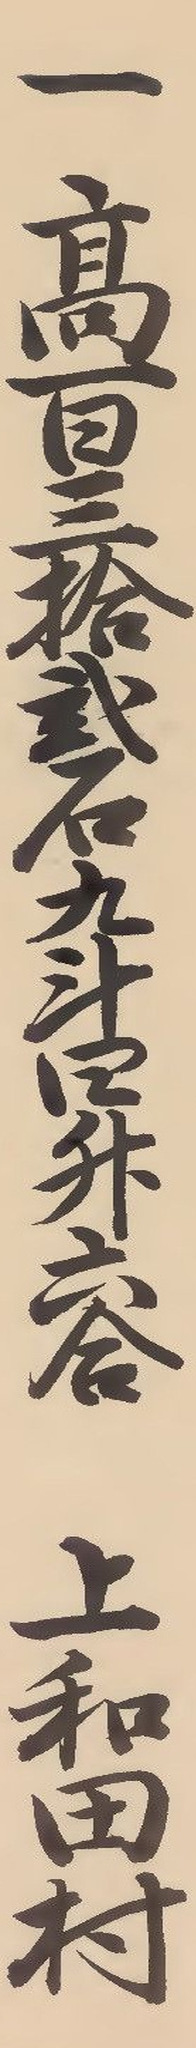一高百三拾弐石九斗四升六合上和田村
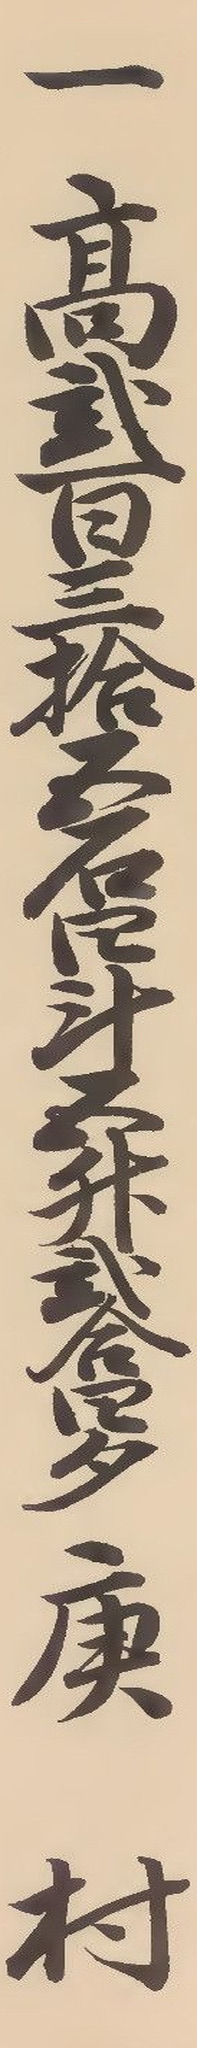一高弐百三拾五石四斗五升弐合四勺庚村
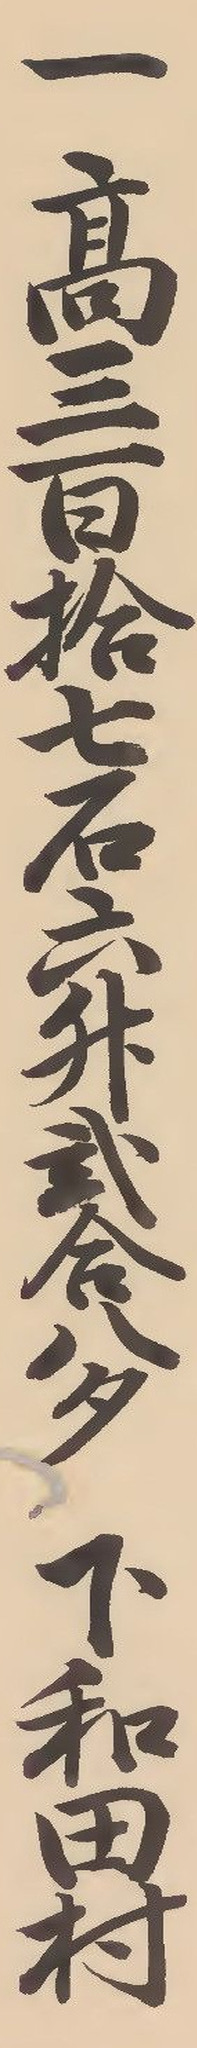一高三百拾七石六升弐合八勺下和田村

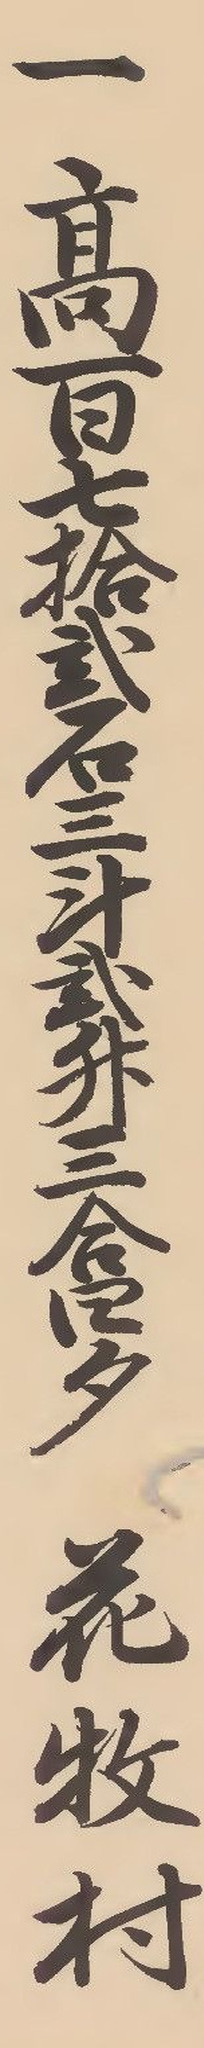一高百七拾弐石三斗弐升三合四勺花牧村
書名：越後国郷帳　下
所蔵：国立公文書館 National Archives of Japan
